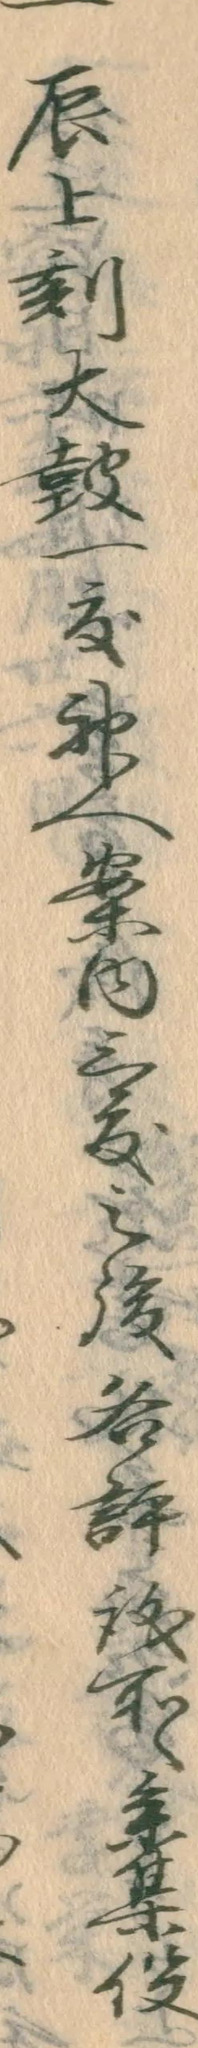一辰上刻大鼓一度神人案内三度之後各評議所へ参集役
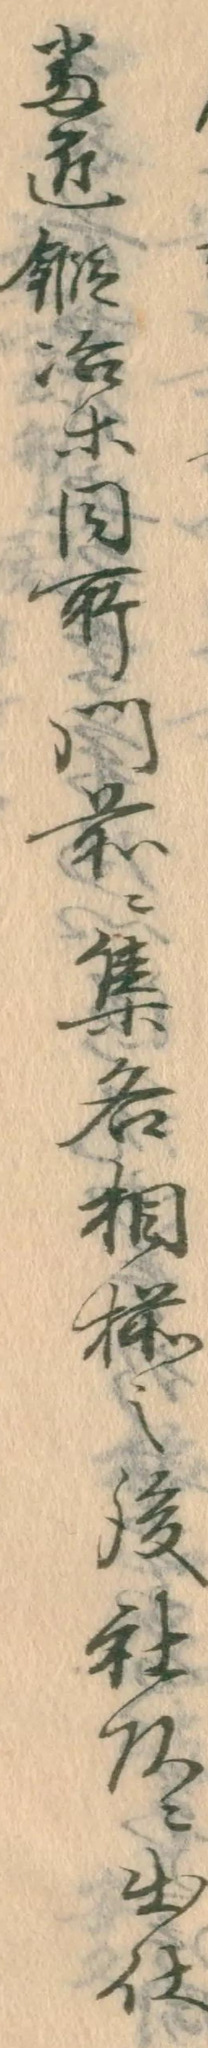番匠鍛冶等同所門前ニ集各相揃之後社頭ニ出仕
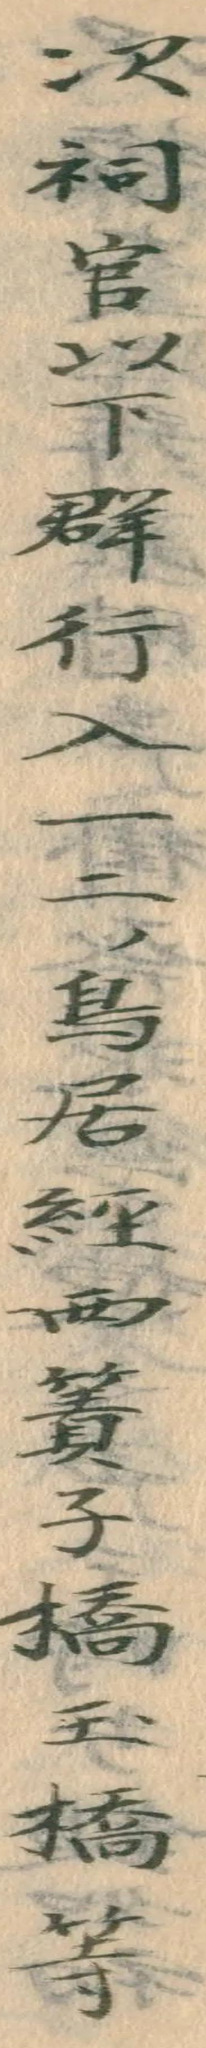次祠官以下群行入一二ノ鳥居経西簀子橋玉橋等
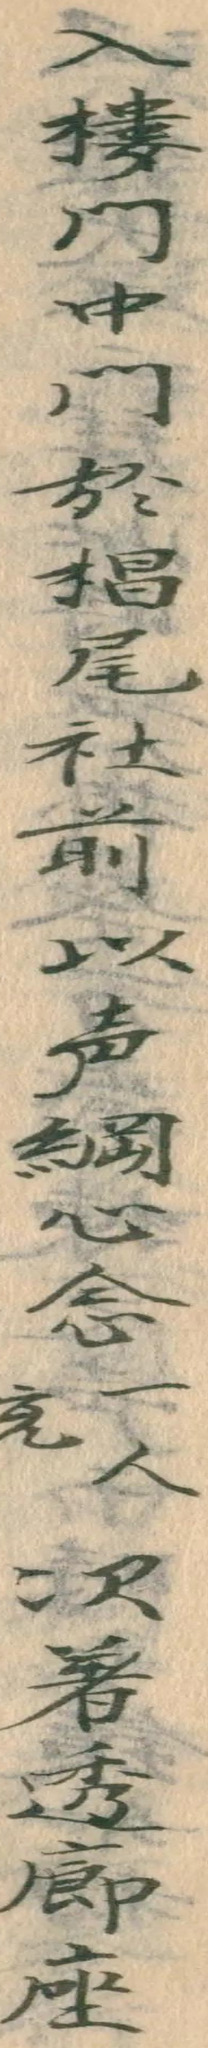入楼門中門於椙尾社前以声綱心念一人充次着透廊座
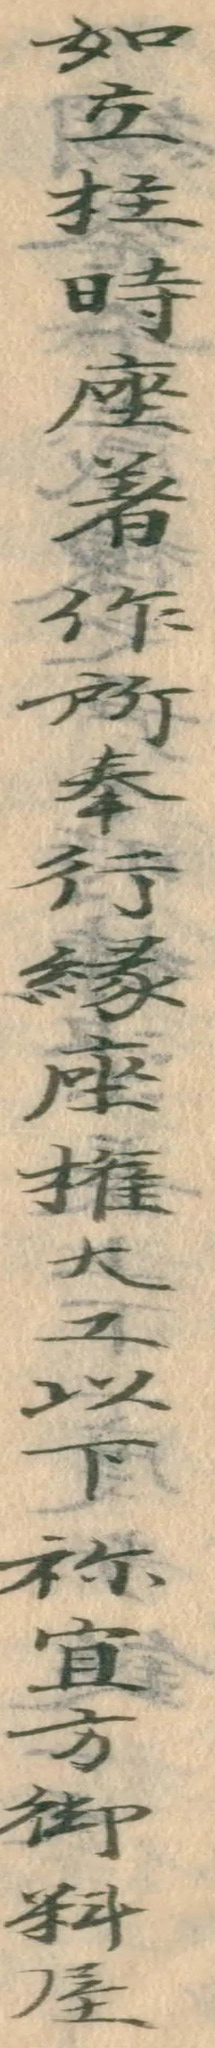如立柱時座着作所奉行縁座権大工以下祢宣方御料屋
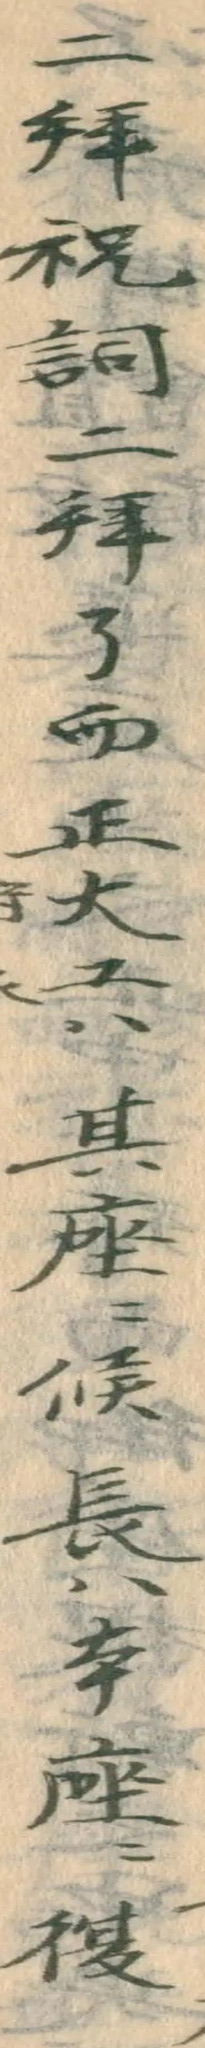二拝祝詞二拝了而正大工ハ其座ニ候長ハ本座ニ復
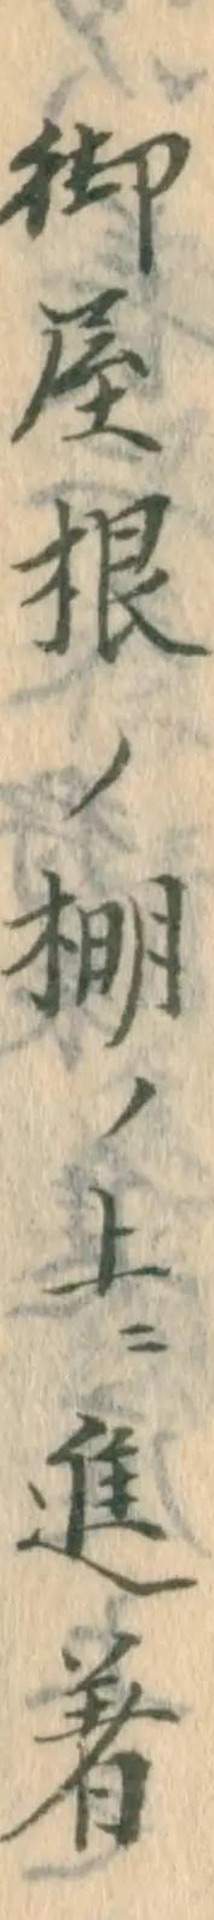御屋根ノ棚ノ上ニ進着

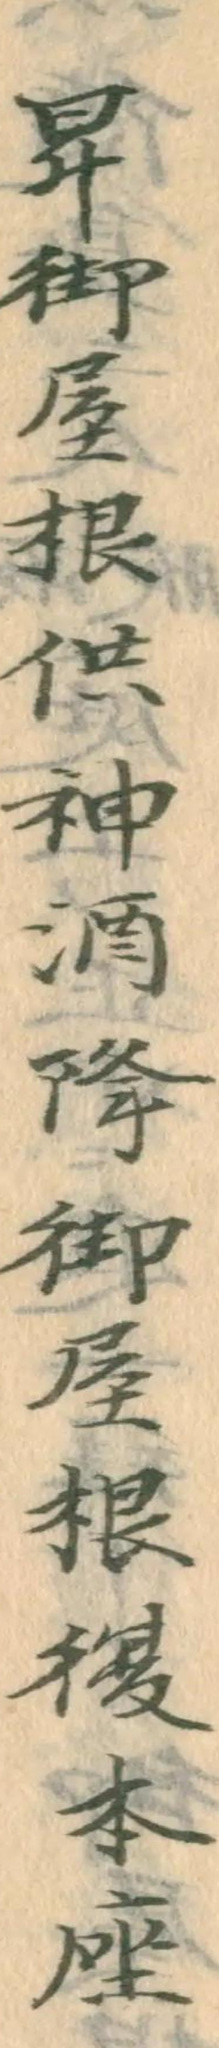昇御屋根供神酒降御屋根復本座
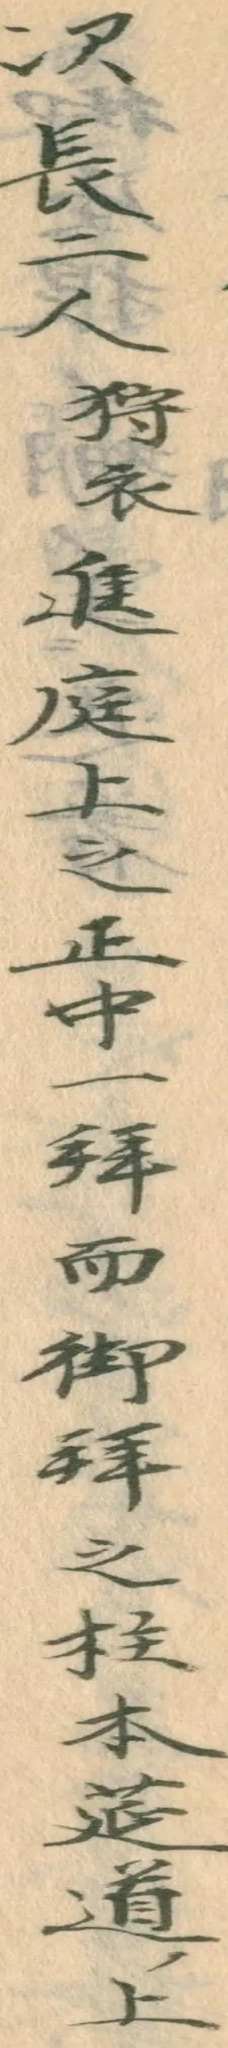次長二人狩衣進庭上之正中一拝而御拝之柱本莚道ノ上
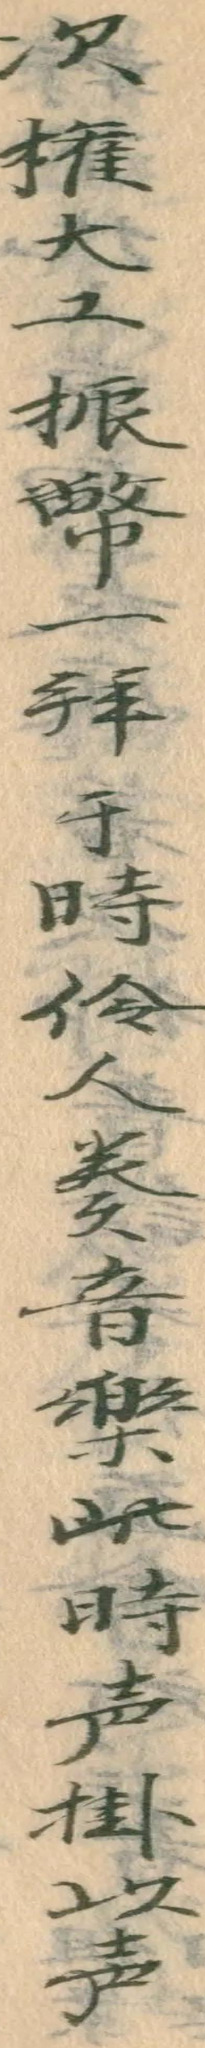次権大工振幣一拝于時伶人奏音楽此時声掛以声
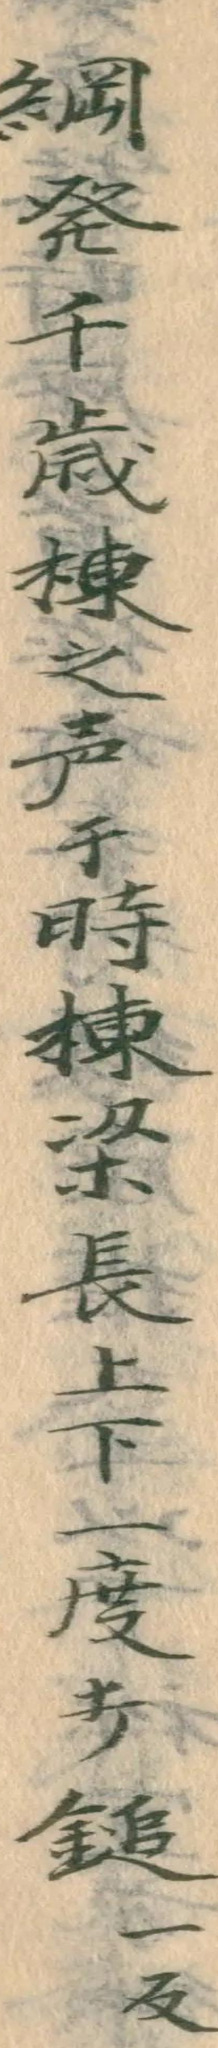綱発千歳棟之声于時棟梁長上下一度打鎚一反
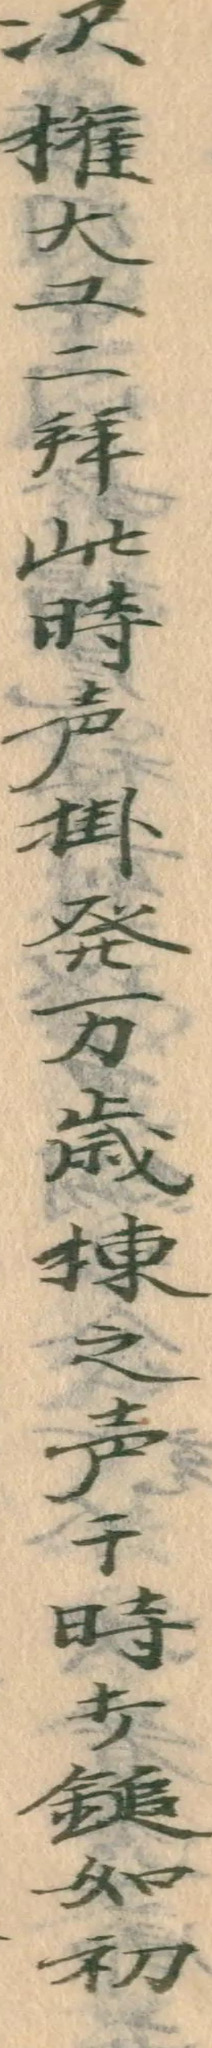次権大工二拝此時声掛発万歳棟之声于時打鎚如初
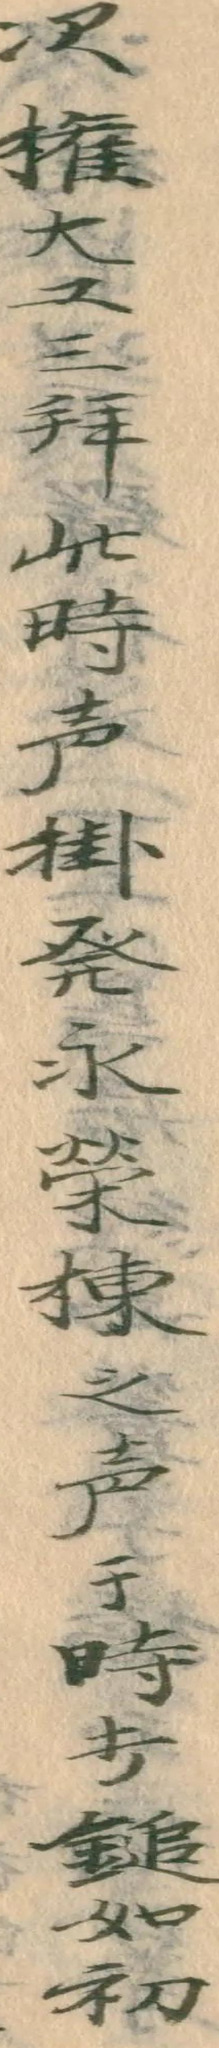次権大工三拝此時声掛発永栄棟之声于時打鎚如初
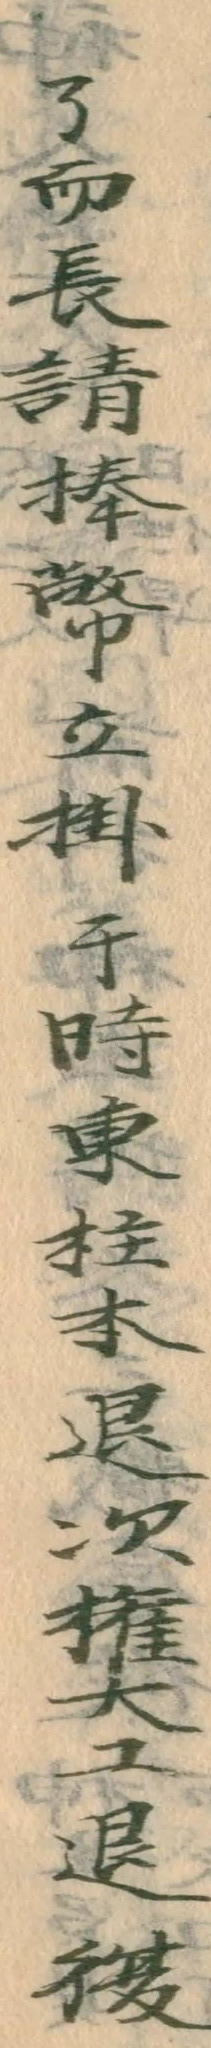了而長請捧幣立掛于時東柱本退次権大工退復
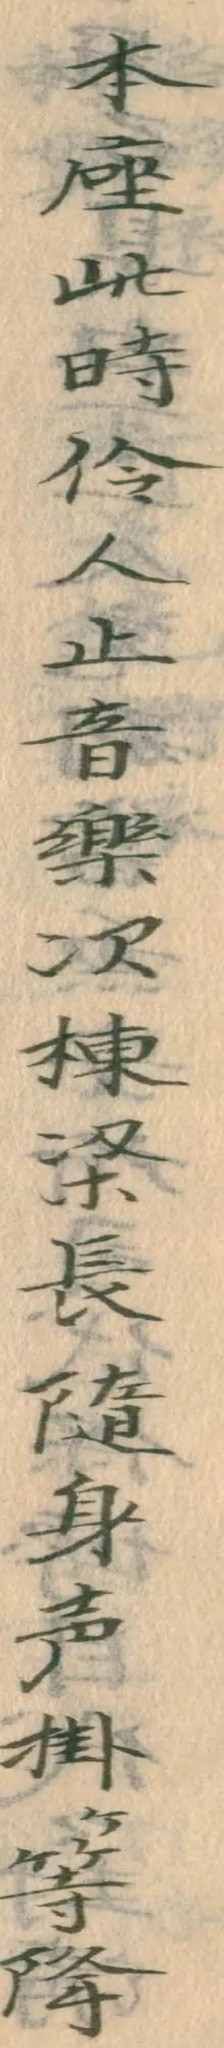本座此時伶人止音楽次棟梁長随身声掛ケ等降
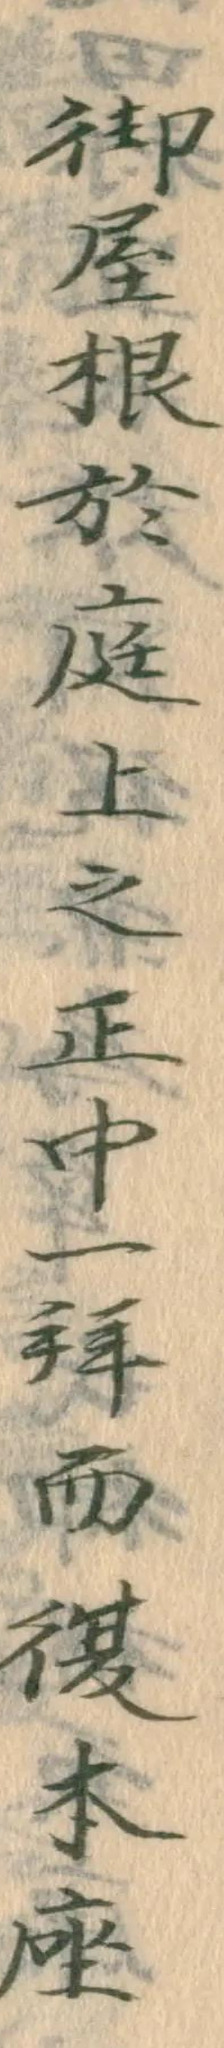御屋根於庭上之正中一拝而復本座
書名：賀茂社記録. 第17冊
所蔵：国立国会図書館 National Diet Library, JAPAN
